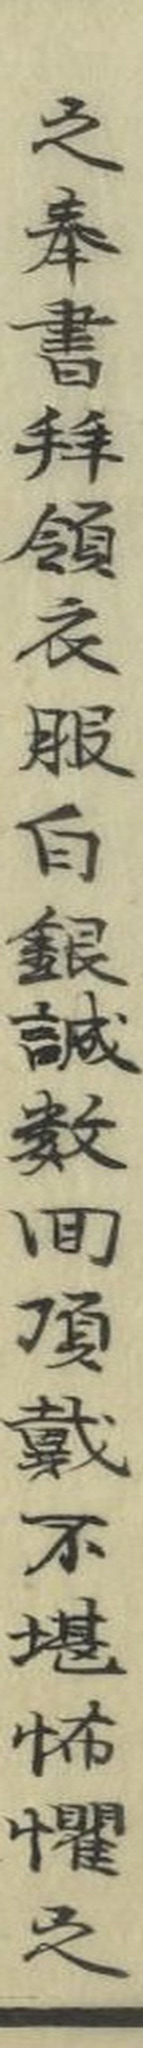之奉書拝領衣服白銀誠数回頂戴不堪怖懼之
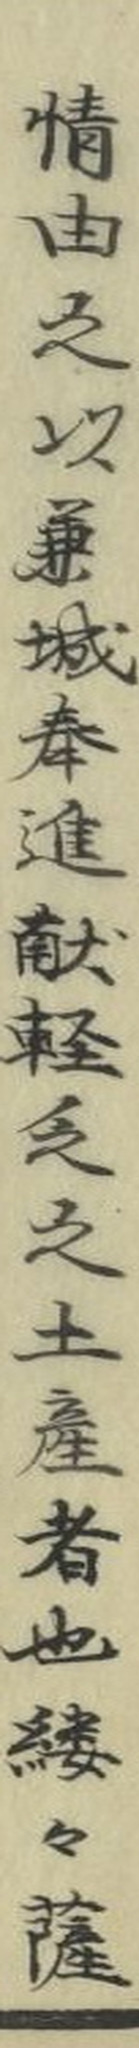情由之以兼城奉進献軽乏之土産者也緌々薩
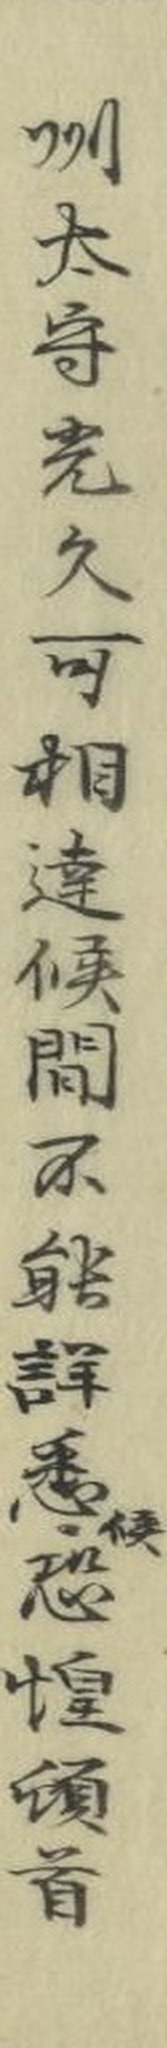州太守充久可相達候間不能詳悉候恐惶頓首
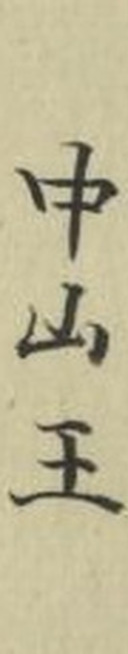中山王
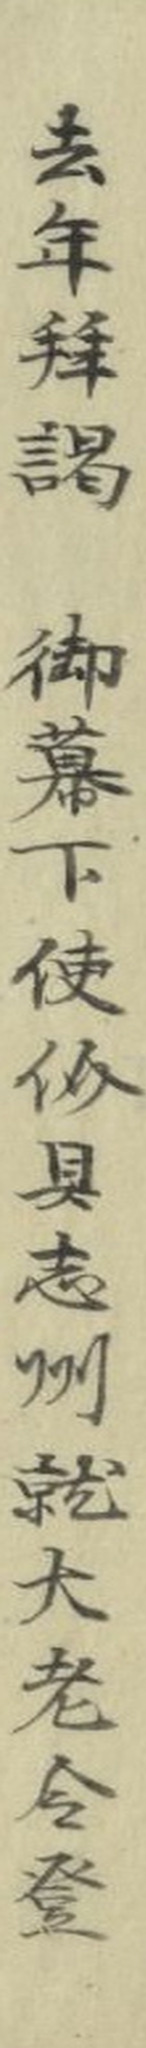去年拝謁御幕下使价具志州就大老令登
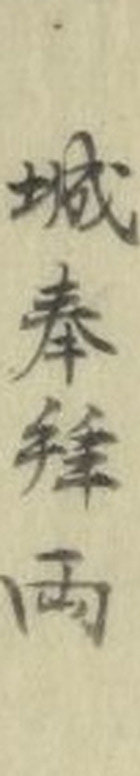城奉拝両
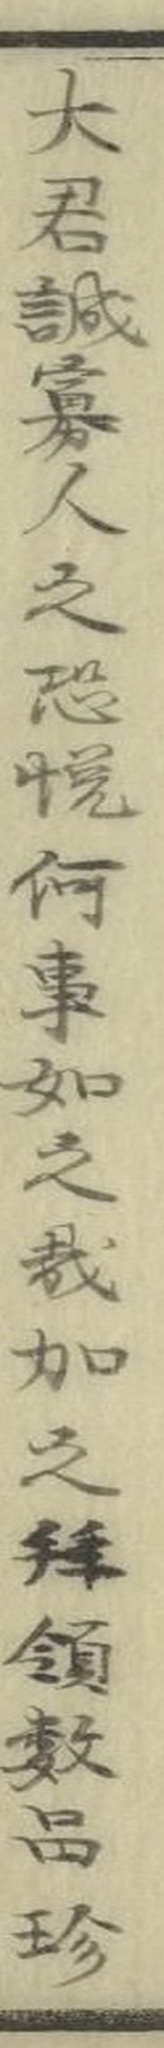大君誠寡人之恐悦何事如之裁加之拝領数品珍
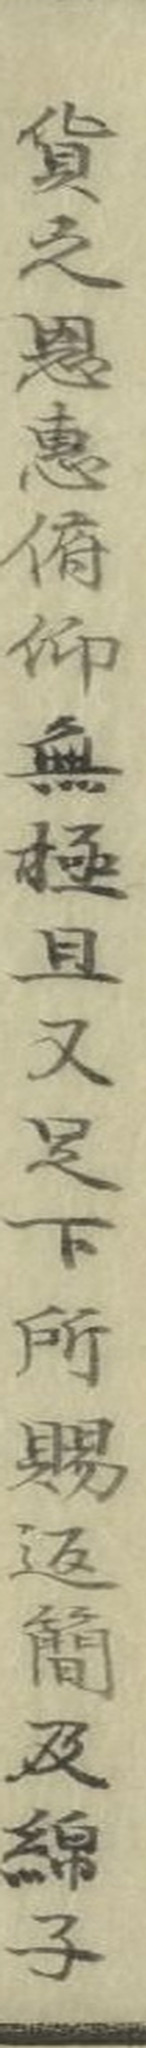貨之恩恵俯抑無極且又足下所賜返簡及綿子
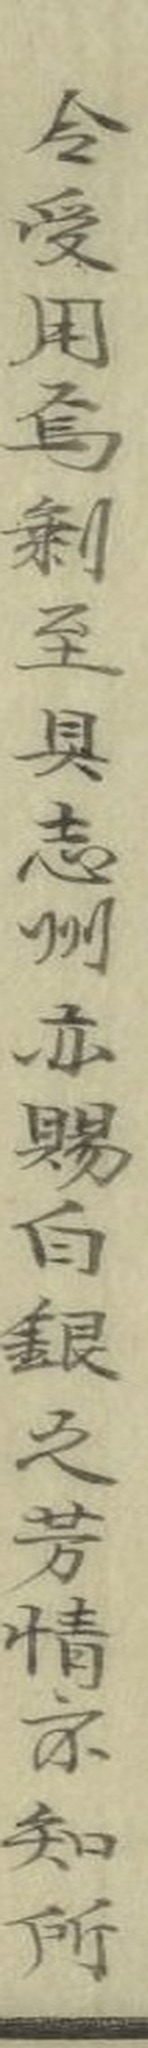令受用焉状剰至具志州亦賜白銀之芳状情不知所
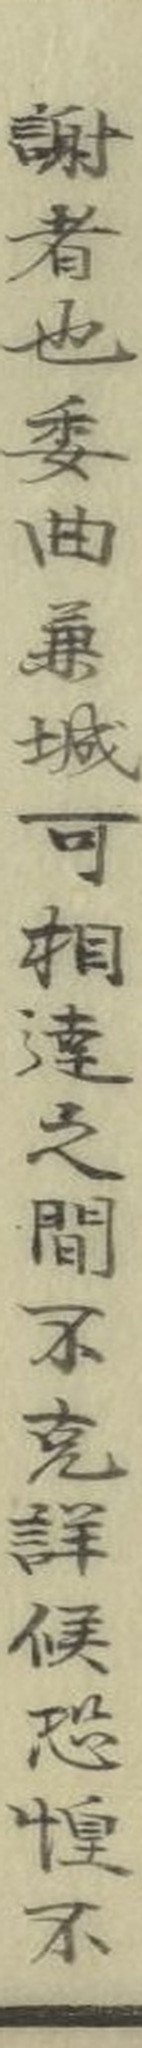謝者也委曲兼城可相達之間不克詳候恐惶不
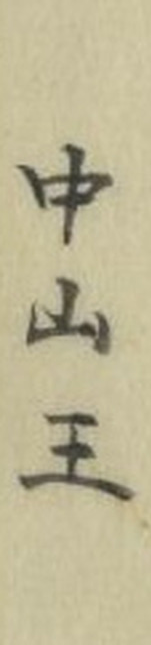中山王

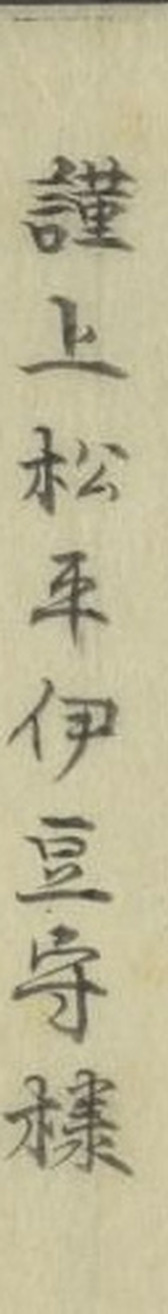謹上松平伊豆守様
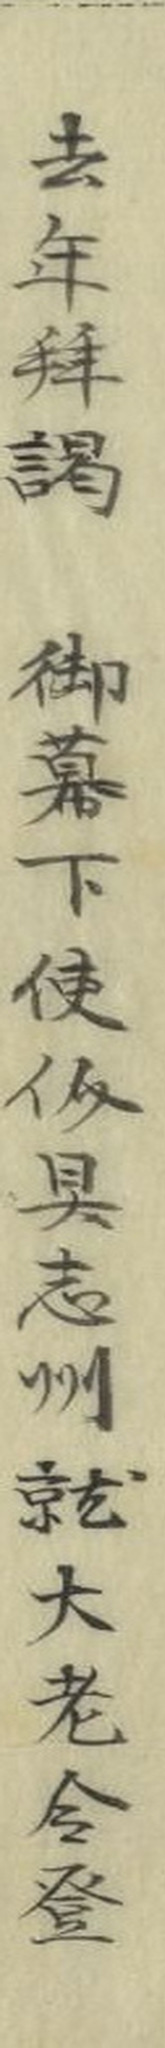去年拝謁御幕下使价具志州就大老令登
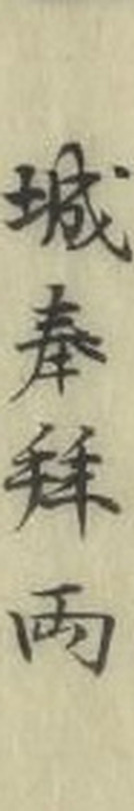城奉拝両
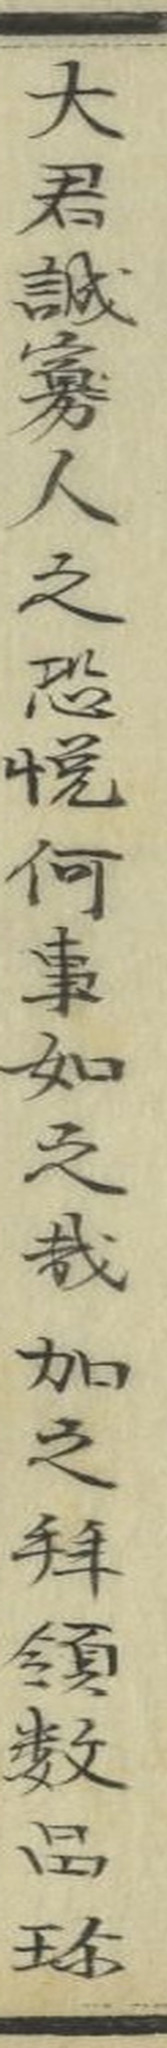大君誠寡人之畏悦何事如之哉加之拝領数品珍
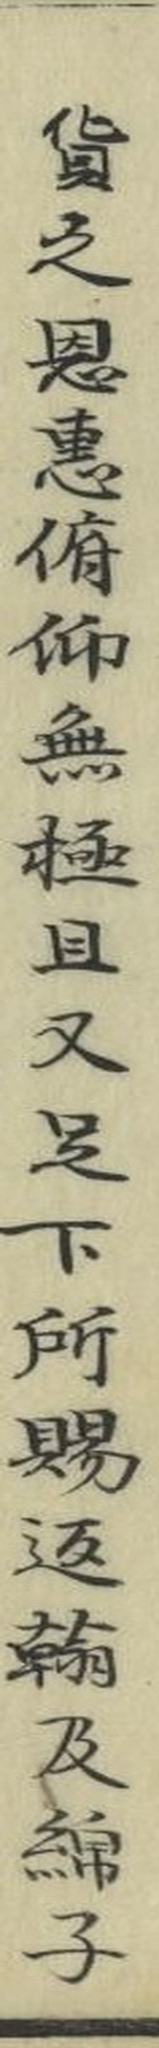貨之恩恵俯仰無極且又足下所賜返翰及綿子
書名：琉球往来（上）
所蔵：University of the Ryukyus Library
